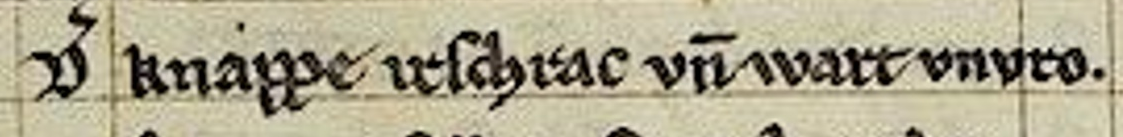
D(er) knappe irſchrac vn(d) wart vnvro.
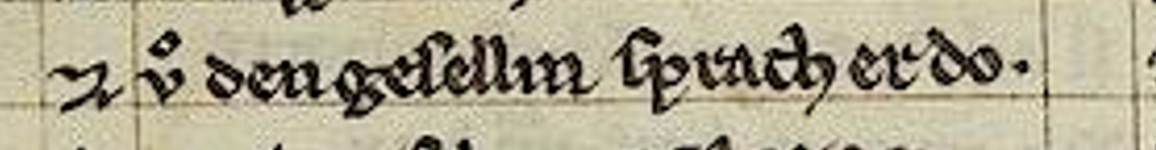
Zv°o den geſellin ſprach er do.
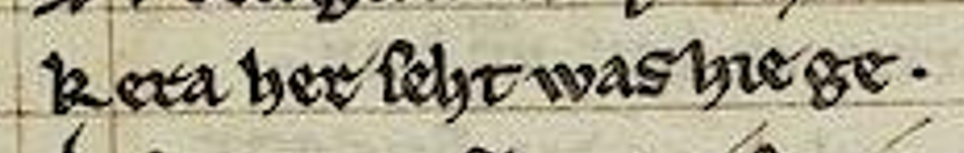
Kera her ſeht was hie ge.
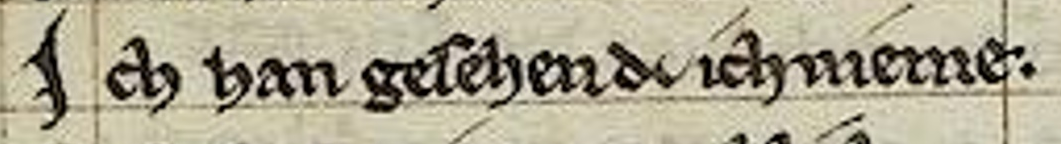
Ich han geſehen d(az) ich nieme.
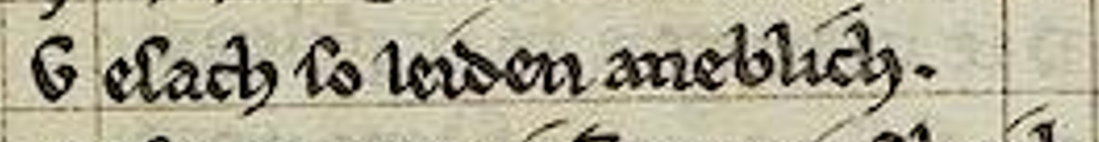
Geſach ſo leiden aneblich.
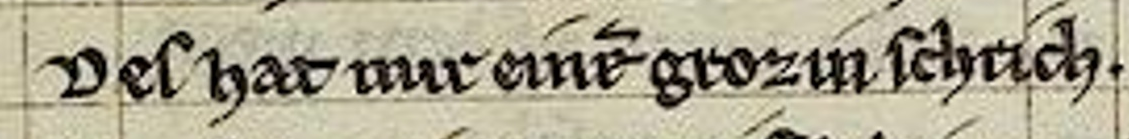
Deſ hat mir eine(n) grozin ſchrich.
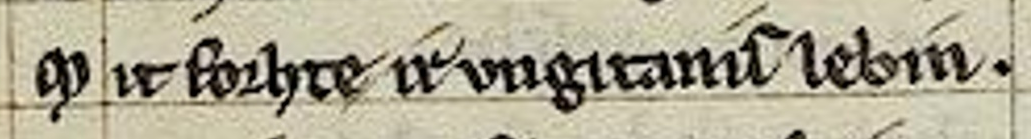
Mit forhte ir vngitaniſ lebin.
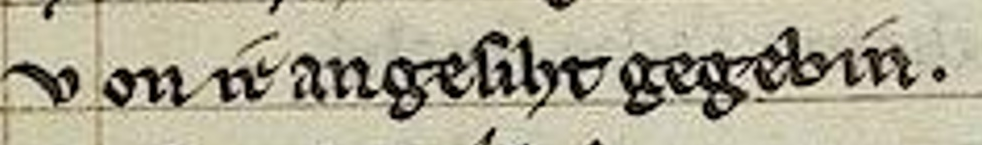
Von ir angeſiht gegebin.
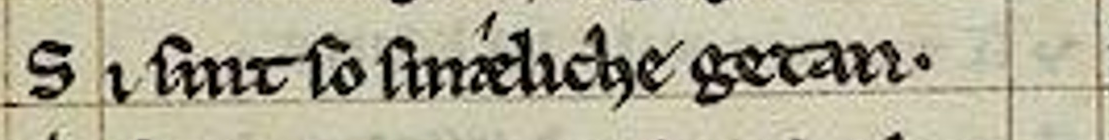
Si ſint ſo ſin[ae]liche getan.
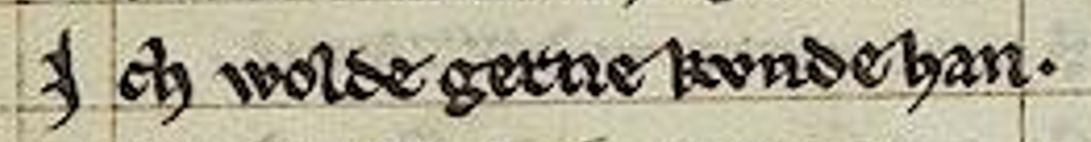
Ich wolde gerne kvnde han.
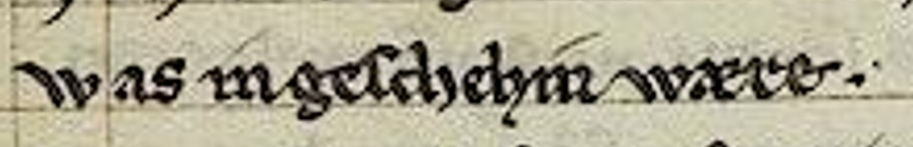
Was in geſchehin w[ae]re.
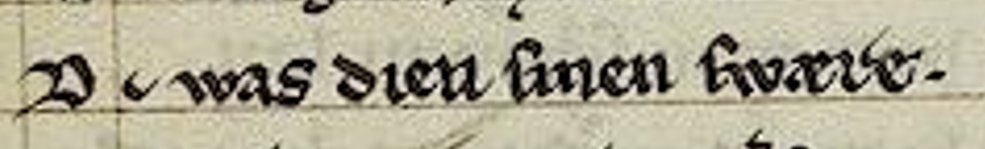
D(az) was dien ſinen ſw[ae]re.
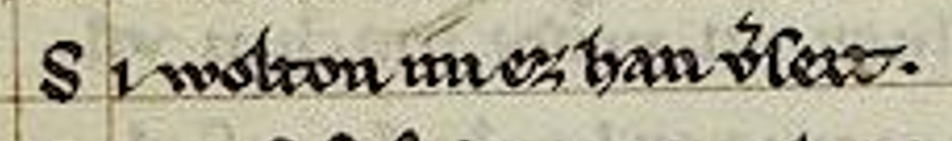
Si wolton im ez han v(er)ſeit.
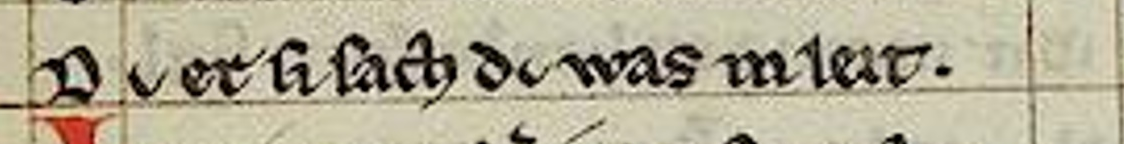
D(az) er ſi ſach d(az) was in leit.
